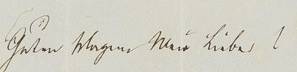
Guten Morgen mein Lieber!
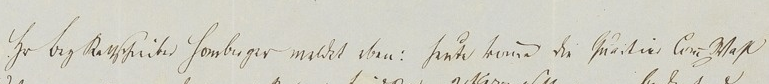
Hr BezRathschreiber Homberger meldet eben: heute komme die QuartierCommWahl
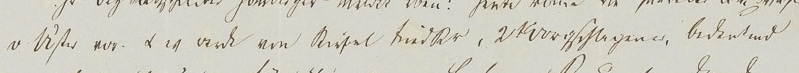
v. Uster vor & es werde von Stiefel FriedRr, 2t Vorgeschlagener, bedeutend
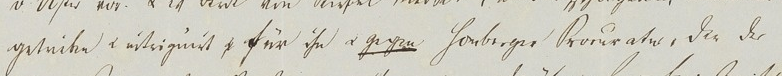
getrieben & intriguirt & für ihn & gegenHomberger Procurator, der der
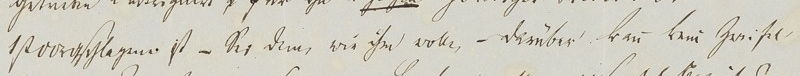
1st vorgeschlagene ist – Sei dem, wie ihm wolle – darüber kann kein Zweifel
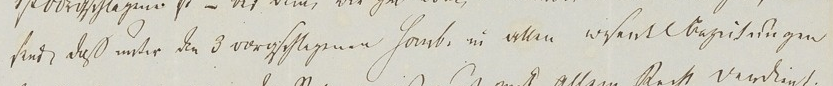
sein, daß unter den 3 vorgeschlagenen Homb. in allen wesentl Beziehungen
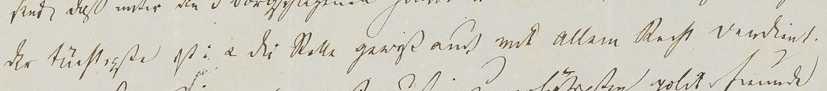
der tüchtigste ist: & die Stelle gewiß auch mit Allem Recht verdient.
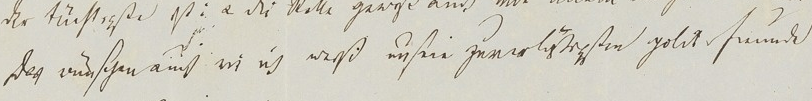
Das wünschen auch wie ich weiß unsere zuverläßigsten polit. Freunde
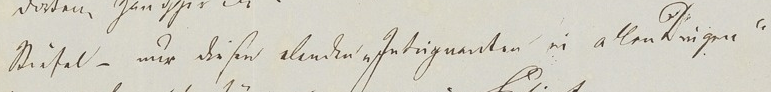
Stiefel – nur diesen elenden «Intriguanten in allen Dingen»
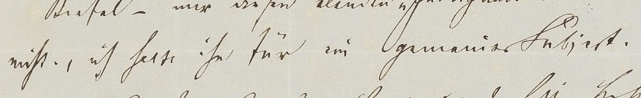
nicht., ich halte ihn für ein gemeines Subject.
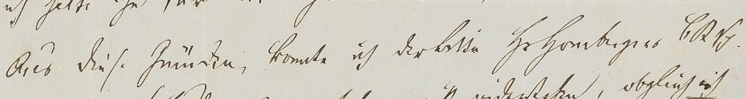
Aus dies. Gründen konnte ich der Bitte Hr HombergersBRSch
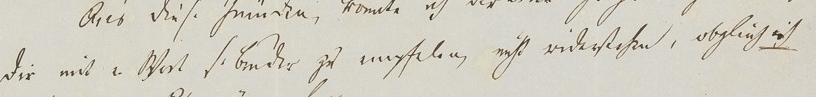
Dir mit e. Wort s. Bruder zu empfehlen, nicht widerstehen, obgleich ich
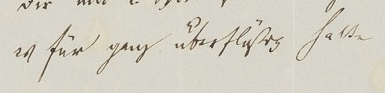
es für ganz überflüßig halte
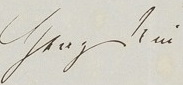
Ganz Dein
